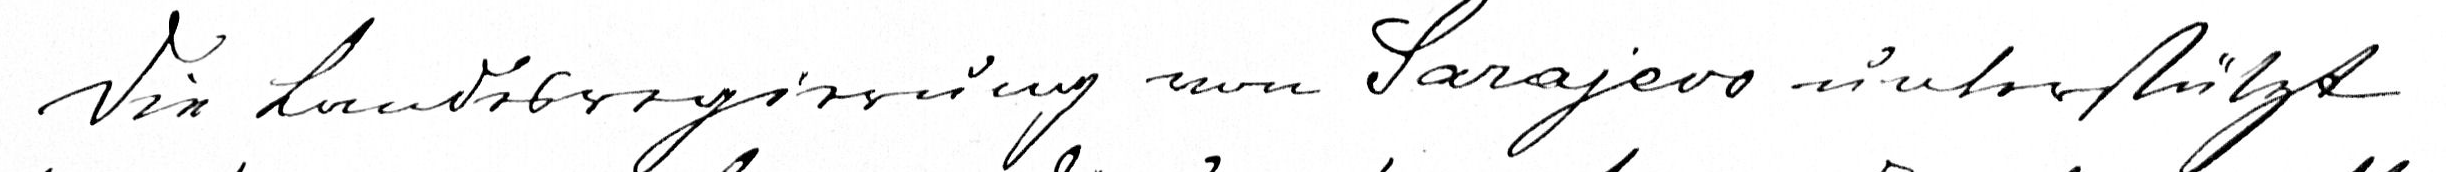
Die Landesregierung von Sarajevo unterstützt
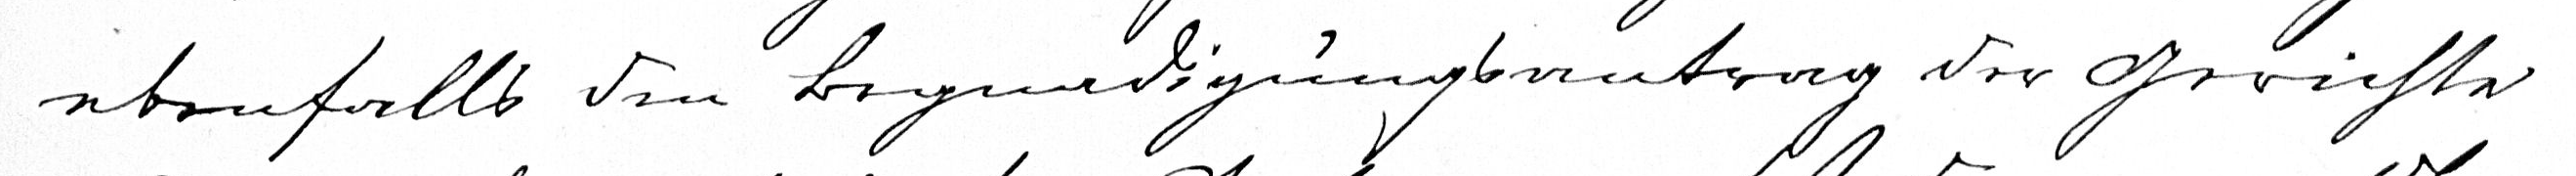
ebenfalls den begnadigungsantrag der Gerichte
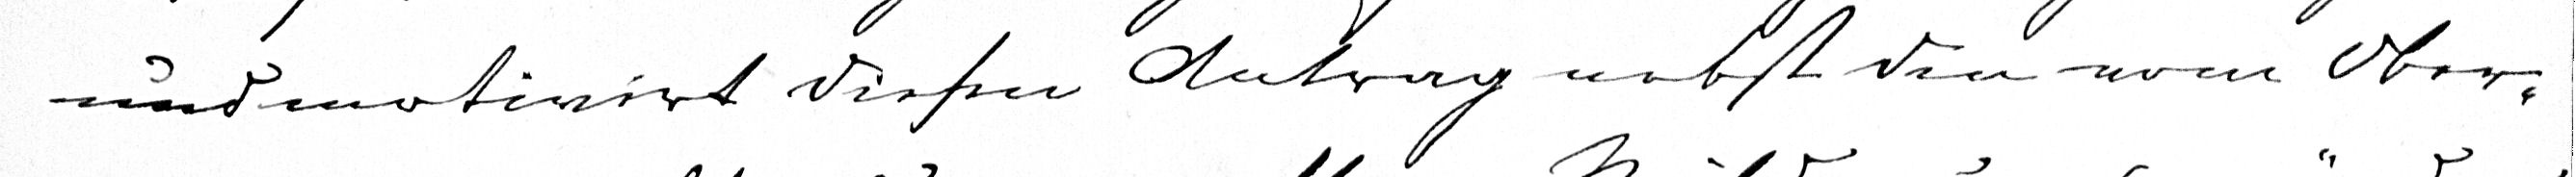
und motivirt diesen Antrag nebst den vom Ober¬
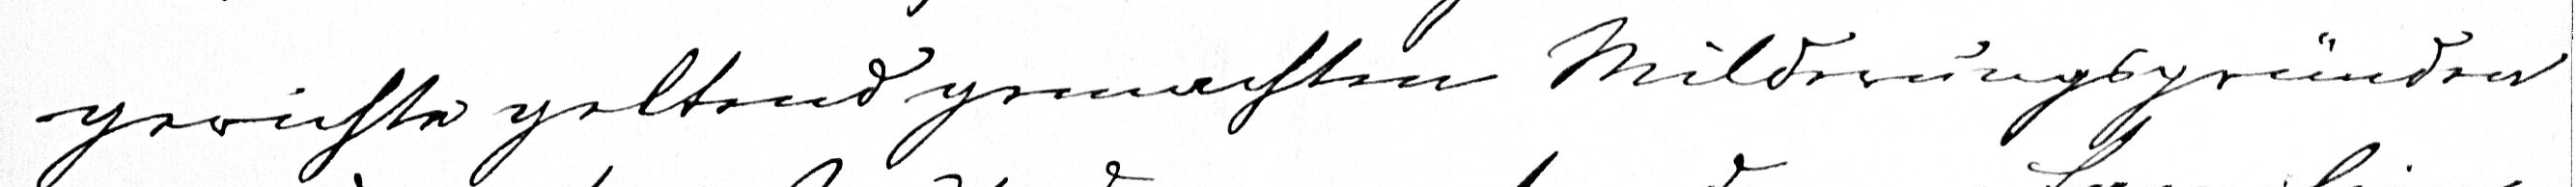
gerichte geltend gemachten Milderungsgründen
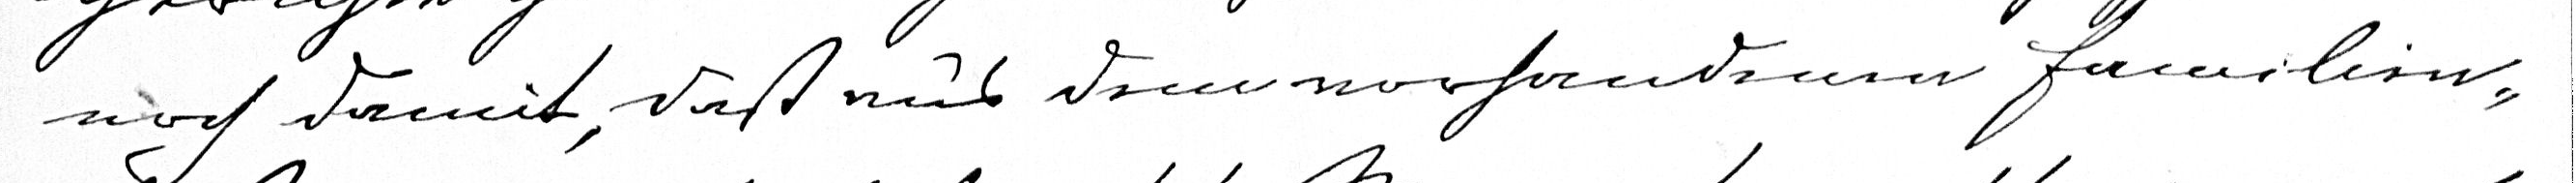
noch damit, daß aus dem vorhandenen Familien¬
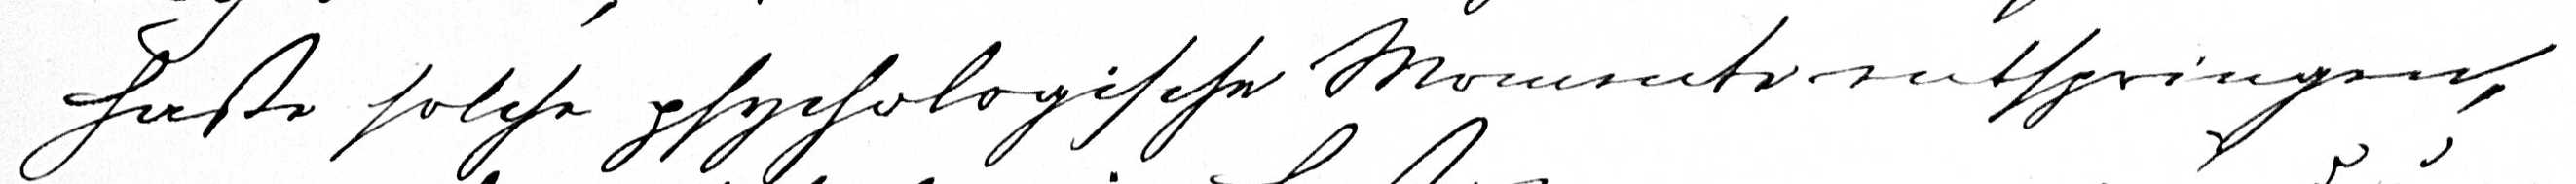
haße solche psychologische Momente entspringen,
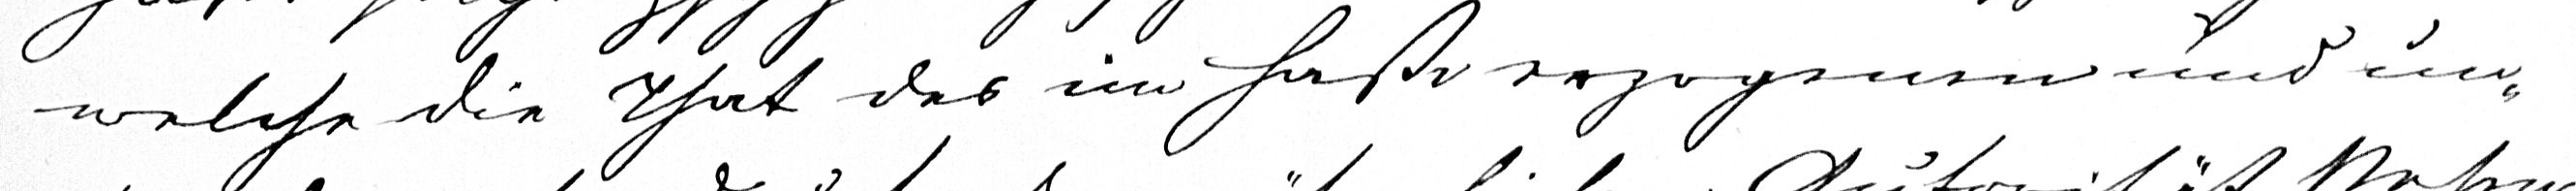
welche die That das im haße erzogenen und un¬
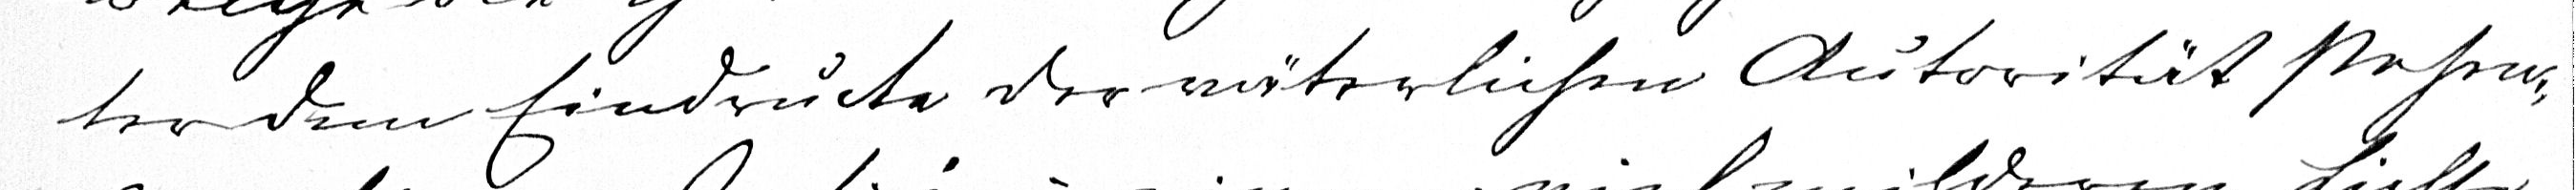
ter dem Eindrucke der väterlichen Autorität stehen,
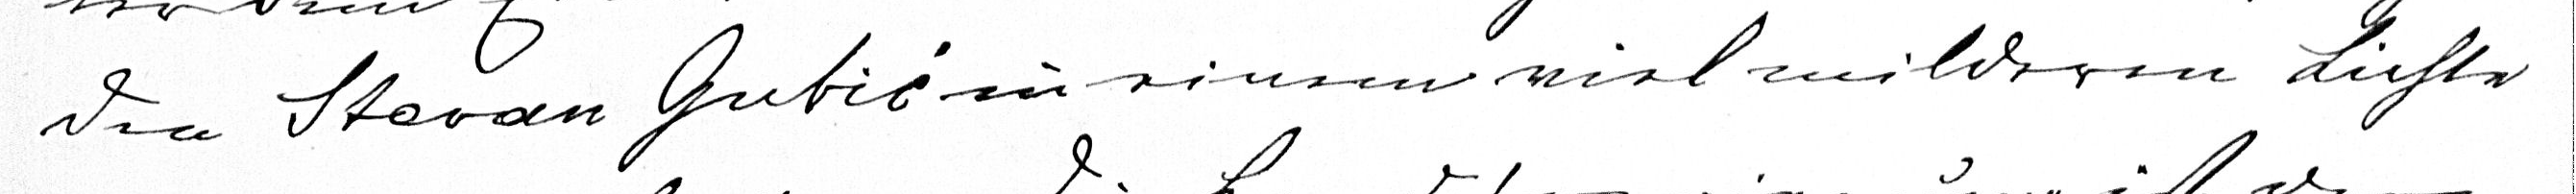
den Stevan Gubić in einem viel milderen Lichte
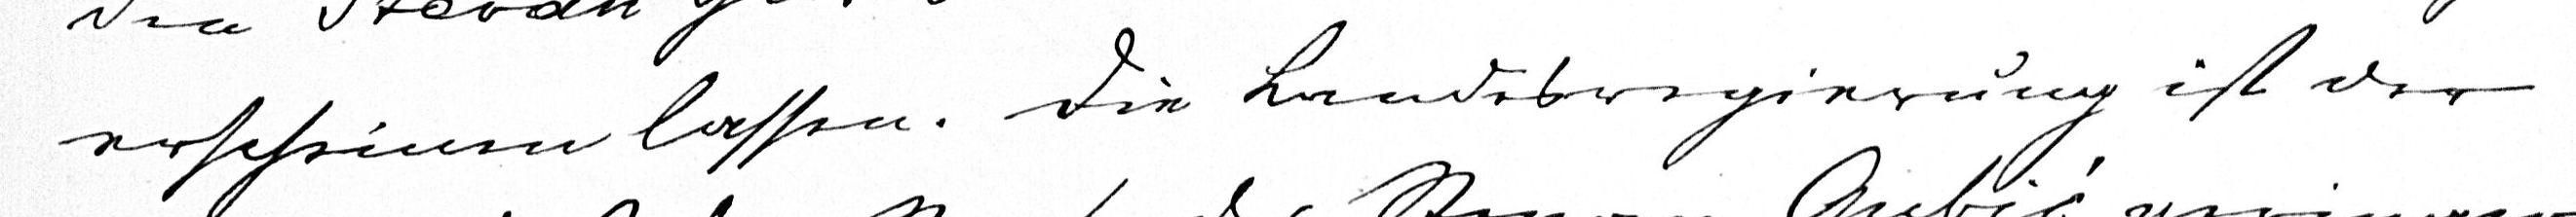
erscheinen lassen. Die Landesregierung ist der
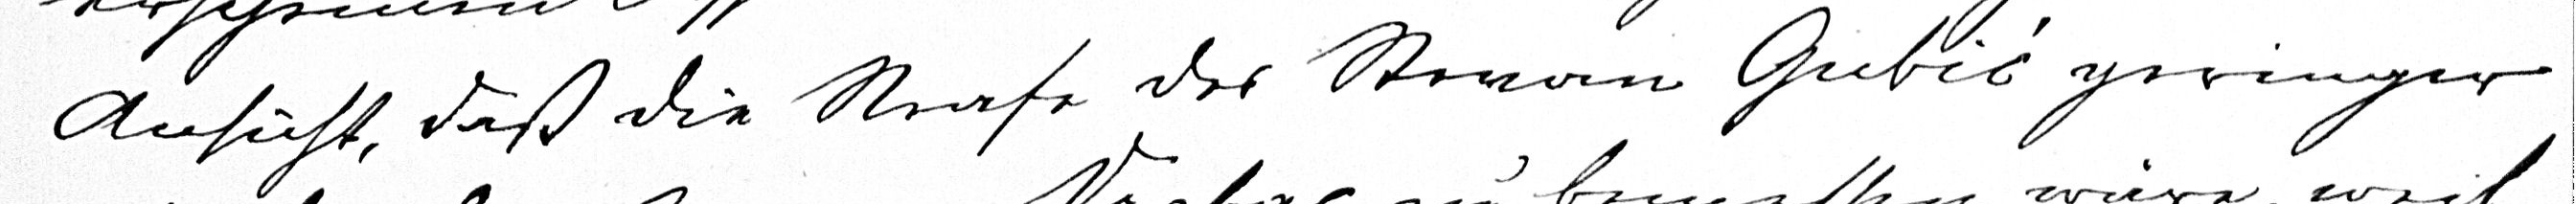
Ansicht, daß die Strafe des Stevan Gubić geringer
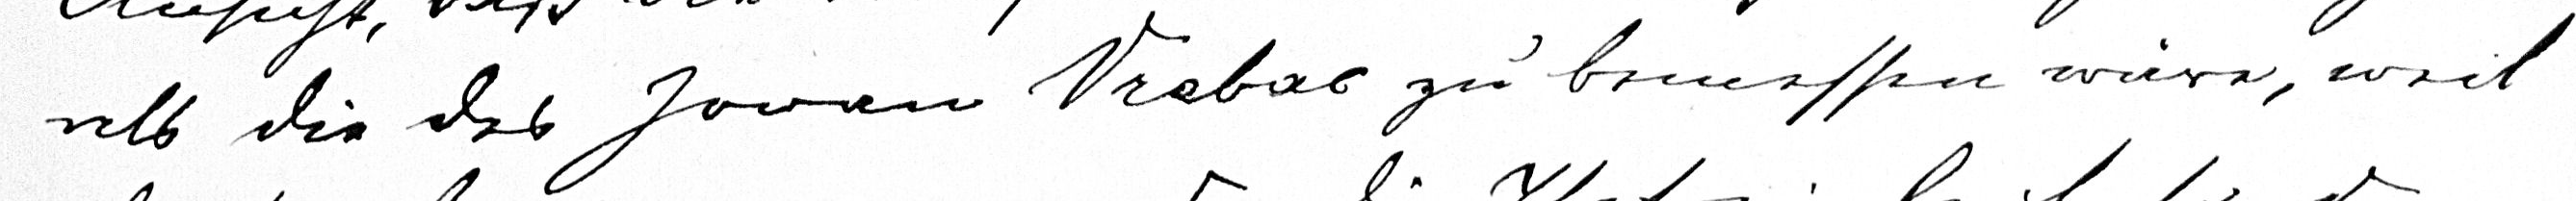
als die des Jovan Vrebac zu bemessen wäre, weil
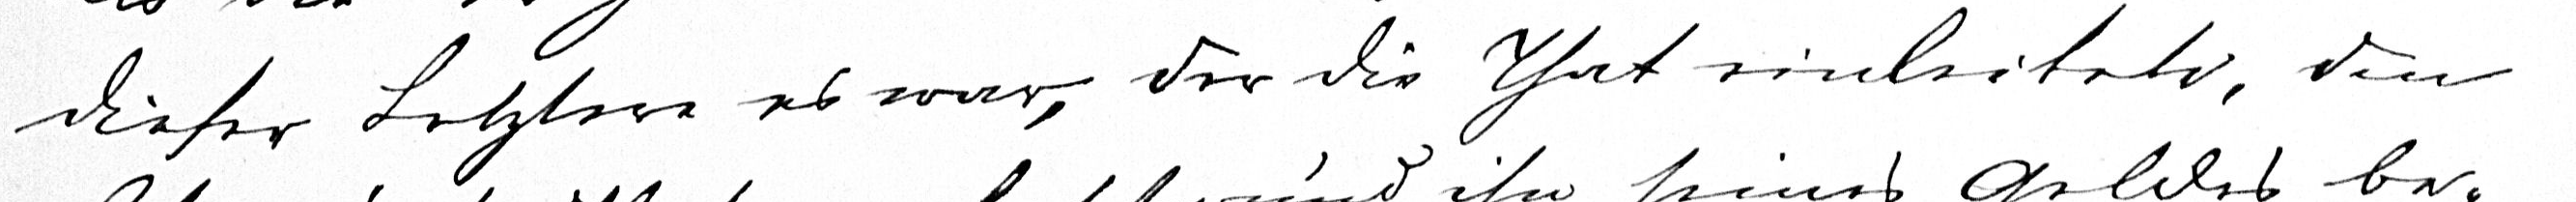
dieser Letztere es war, der die That einleitete, den
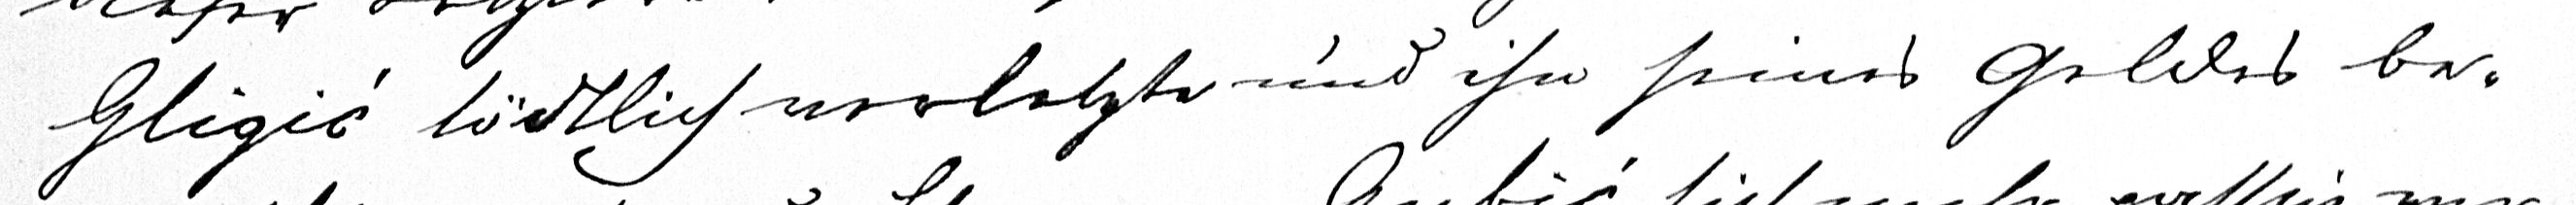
Gligić tödtlich verletzte und ihn seines Geldes be¬
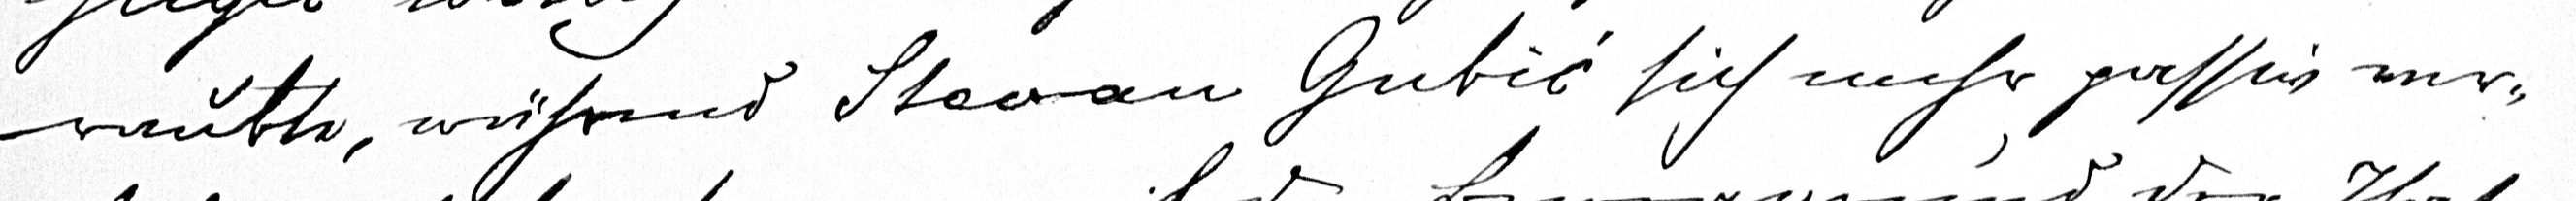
raubte, während Stevan Gubić sich mehr passiv ver¬
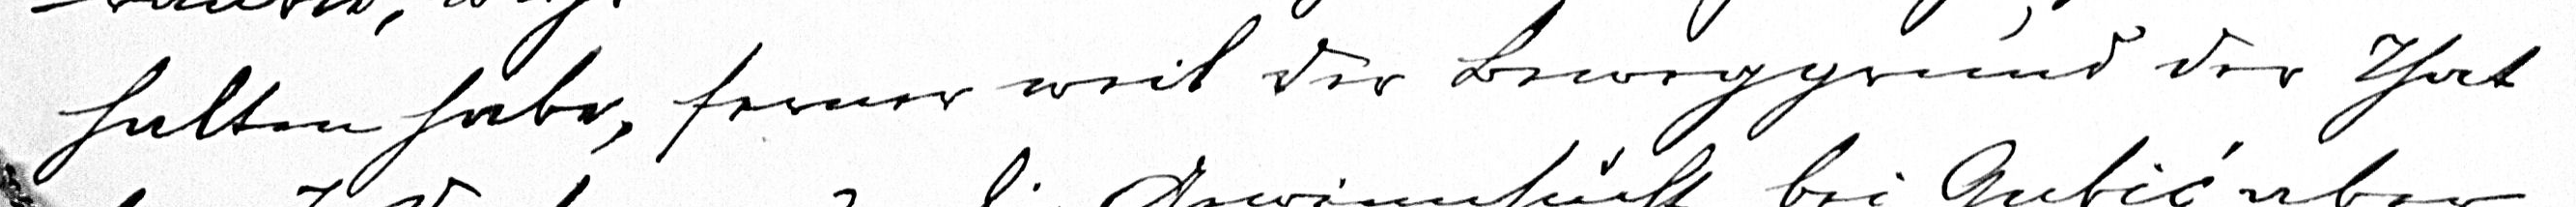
halten habe, ferner weil der Beweggrund der That
